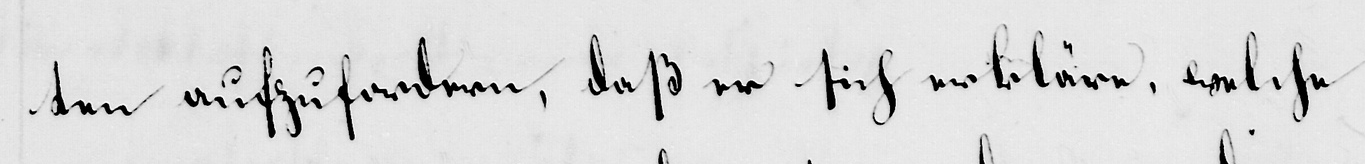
ten aufzufordern, daß er sich erkläre, welche
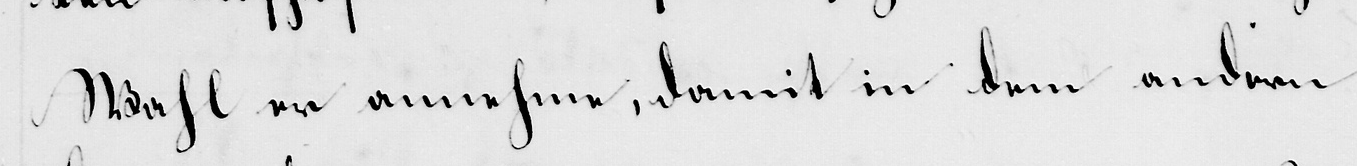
Wahl er annehme, damit in dem andern
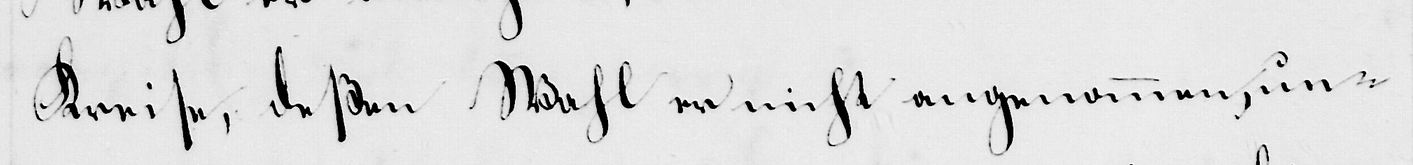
Kreise, deßen Wahl er nicht angenommen, un¬
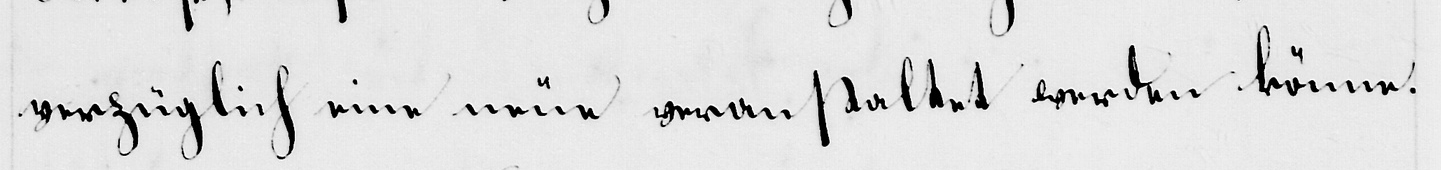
verzüglich eine neue veranstaltet werden könne.
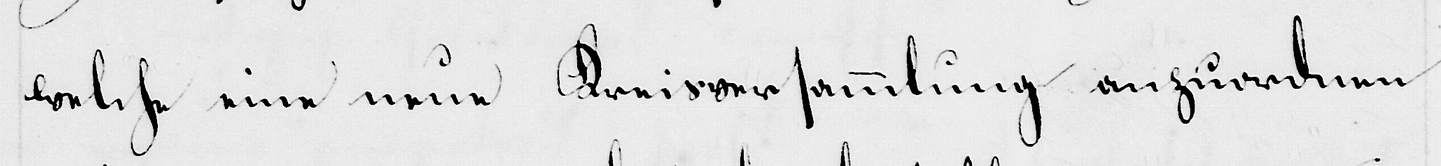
welche eine neue Kreisversammlung anzuordnen
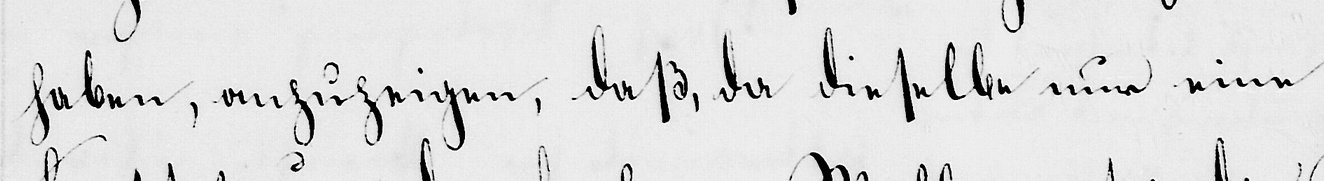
haben, anzuzeigen, daß, da dieselbe nur eine
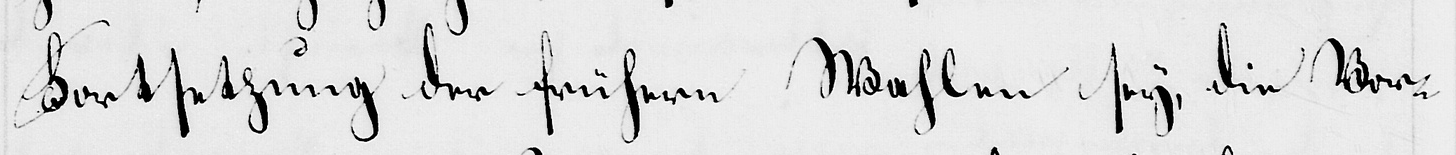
Fortsetzung der frühern Wahlen sey, die Vor¬
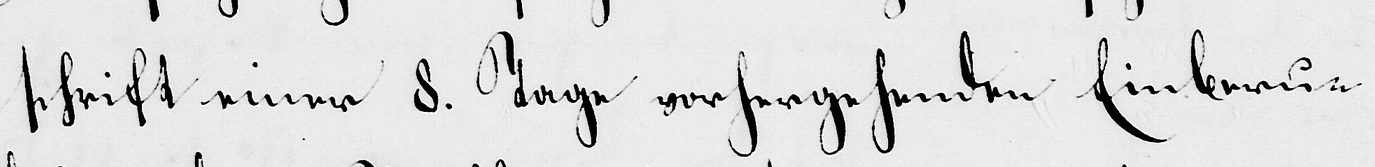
schrift einer 8. Tage vorhergehenden Einberu¬
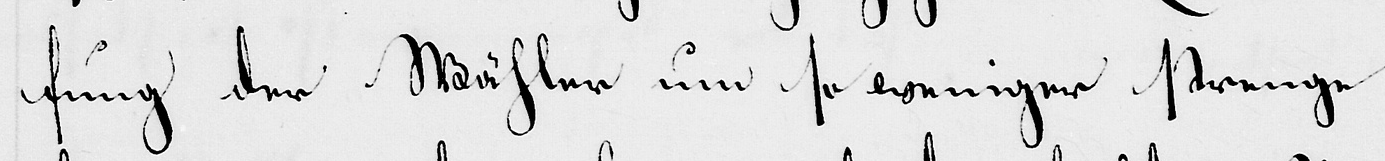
fung der Wähler um so weniger strenge
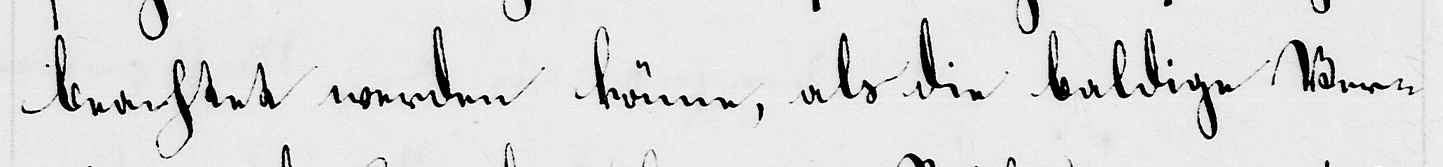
beachtet werden könne, als die baldige Ver¬
